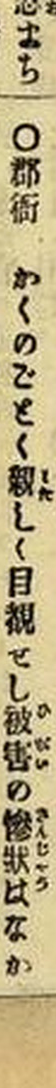○郡衙かくのごとく親しく目覩せし被害の惨狀はなか
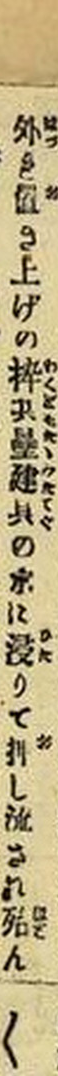外れ置き上げの枠共疂建具の水に浸りて押し流され殆ん
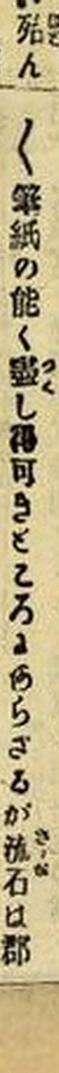〳〵筆紙の能く盡し得可きところにあらざるが流石は郡
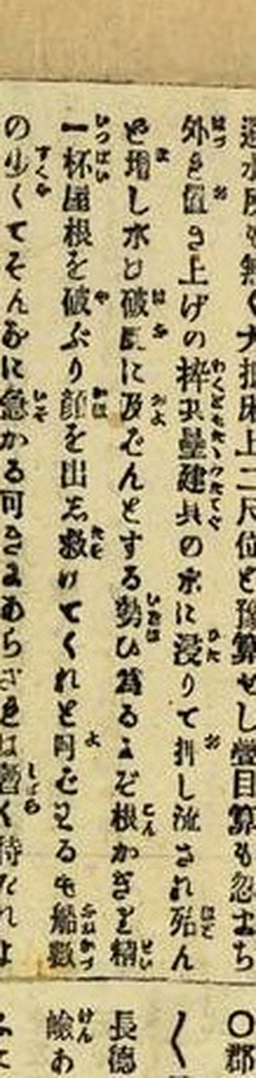ど増し水は破風に及ばんとする勢ひ爲るにぞ根かぎり精
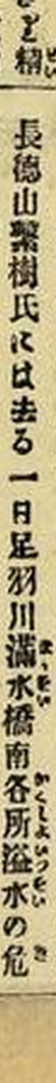長德山繁樹氏には去る一日足羽川滿水橋南各所溢水の危
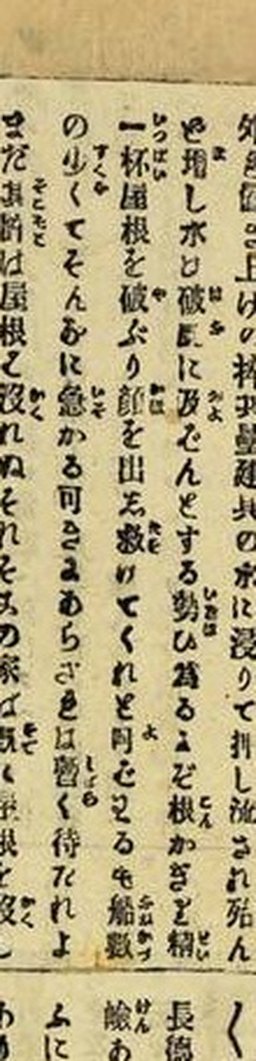一杯屋根を破ぶり顔を出し救けてくれと呼ばわるも船數
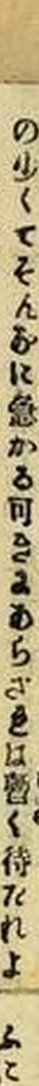の少くてそんなに急かる可きにあらされは暫く待たれよ
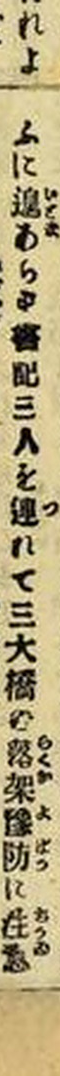ふに遑あらず書記三人を連れて三大橋の落架豫防に注意
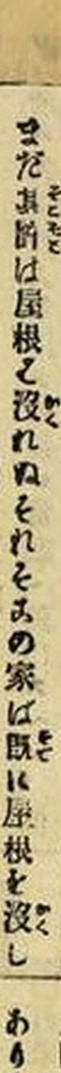まだ其許は屋根は没れぬそれそこの家は既に屋根を没し
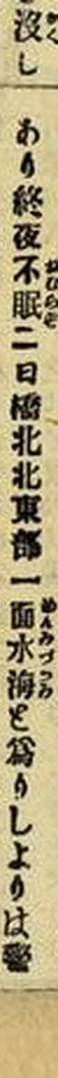あり終夜不眠二日橋北北東部一面水海と爲りしよりは警
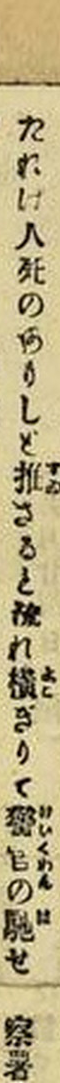たれは人死のありしと推さると流れ横ぎりて警官の馳せ
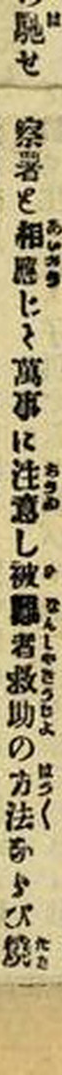察署と相應じて萬事に注意し被難者救助の方法ならび燒
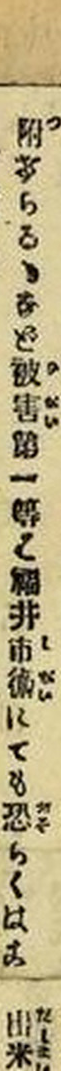附けらるゝなど被害第一等は福井市街にても恐らくはこ
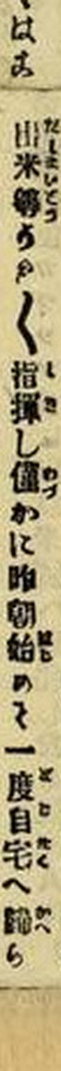出米等かす〳〵指揮し僅かに昨朝始めて一度自宅へ歸ら
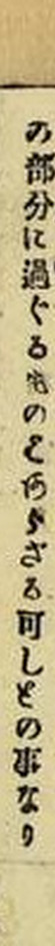の部分に過ぐるものはあらざる可しとの事なり
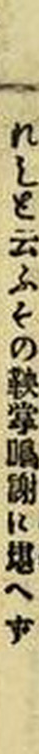れしと云ふその鞅掌鳴謝に堪へず
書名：温古集 五巻
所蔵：福井県文書館 Fukui Prefectural Archives
